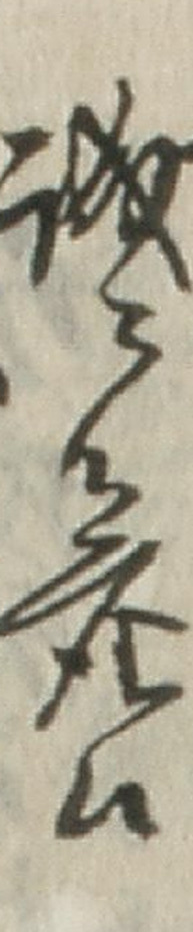誠二御座候
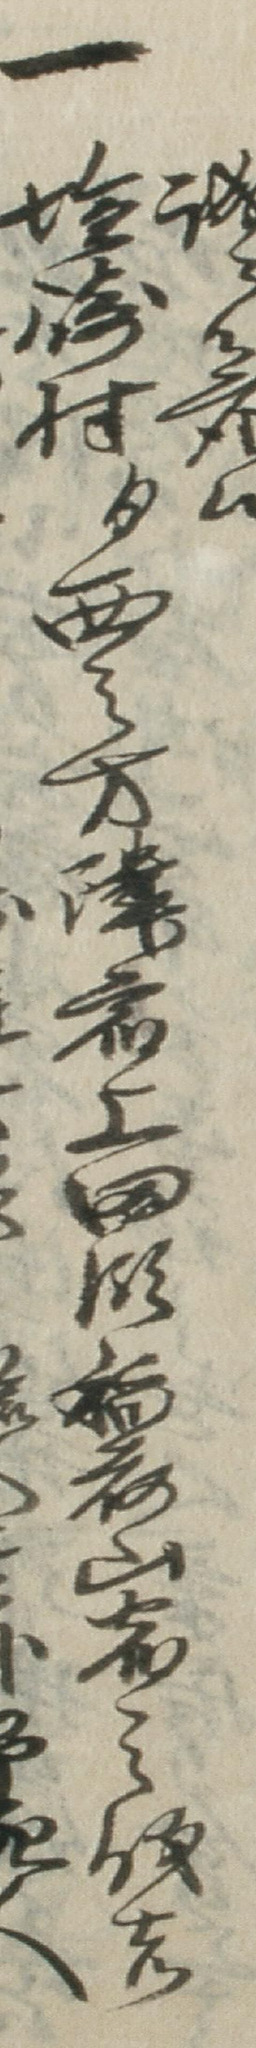一塩崎村ゟ西之方隣宿上田領稲荷山宿之儀ハは
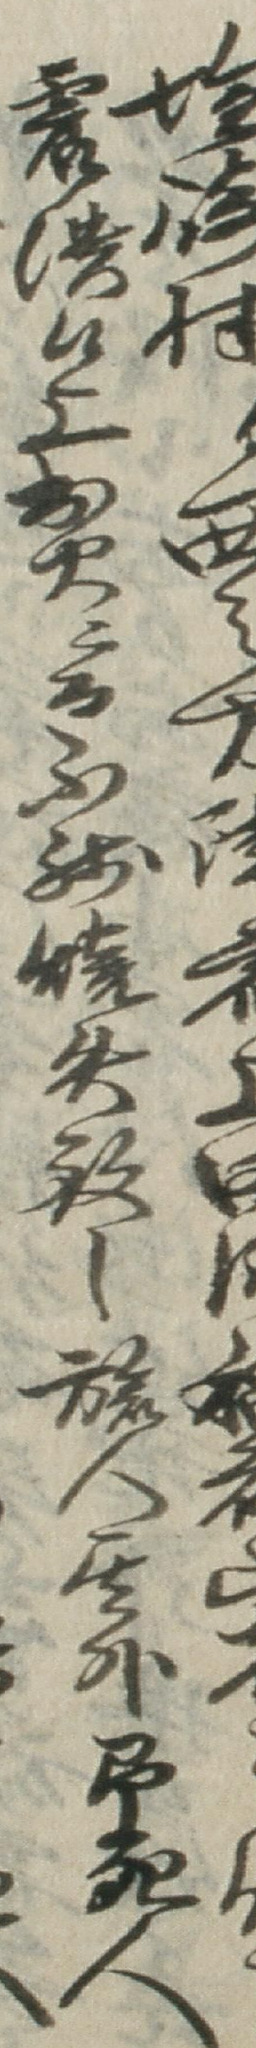震潰候上出火二而不残焼失致し旅人其外即死人
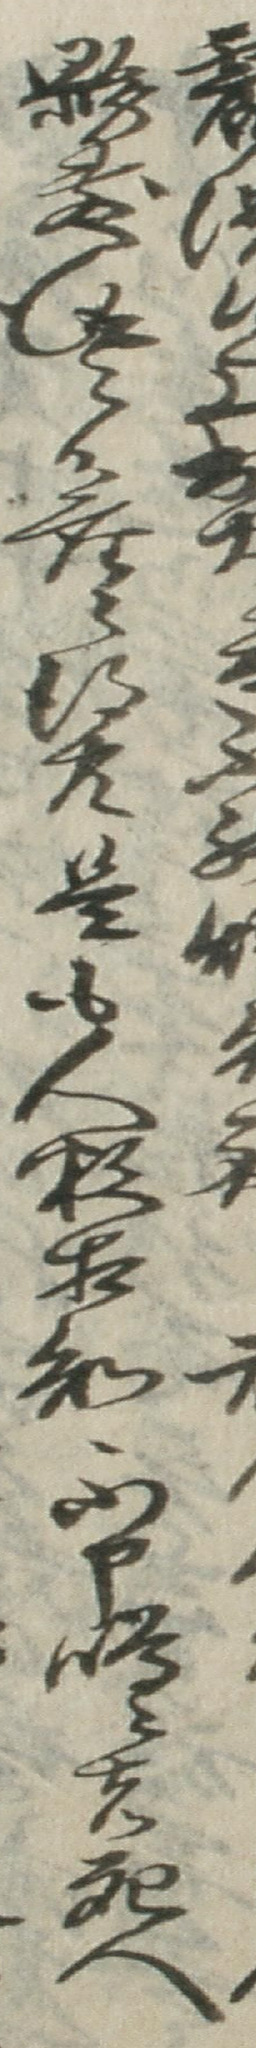夥敷趣二御座候得共是も人数相知不申噂二は死人
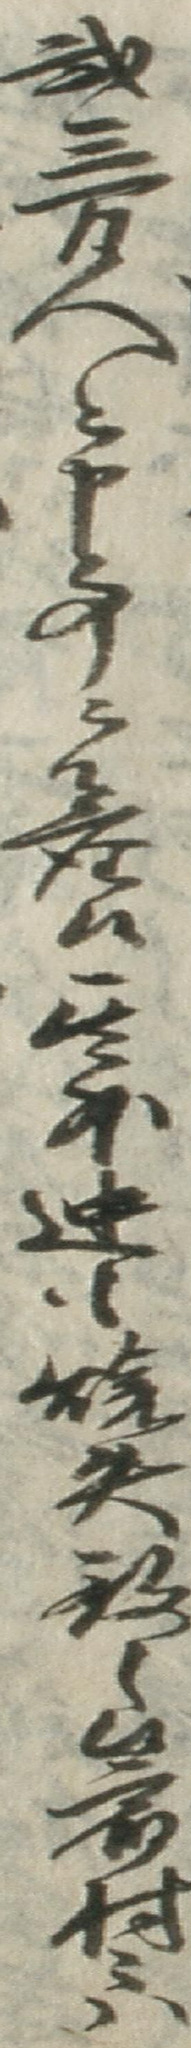弐三万人と申事二御座候其外迚も焼失いたし候宿村々ハ
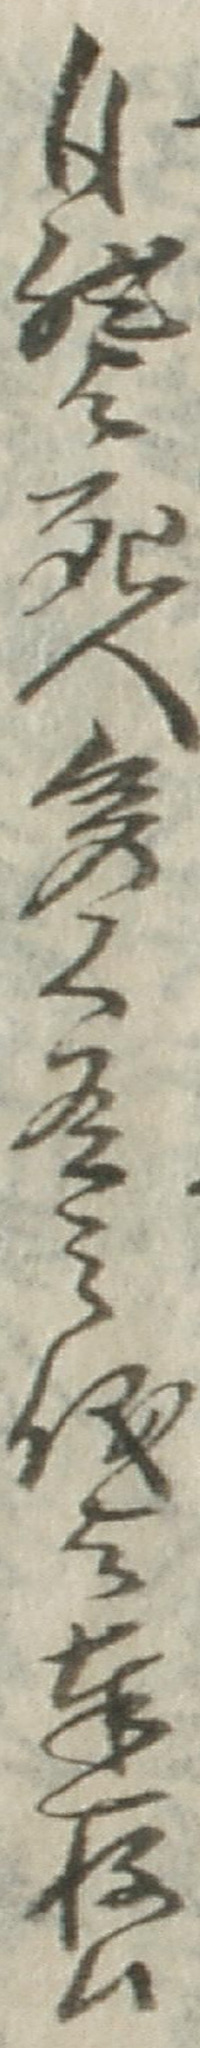自然と死人多く有之候儀と奉存候
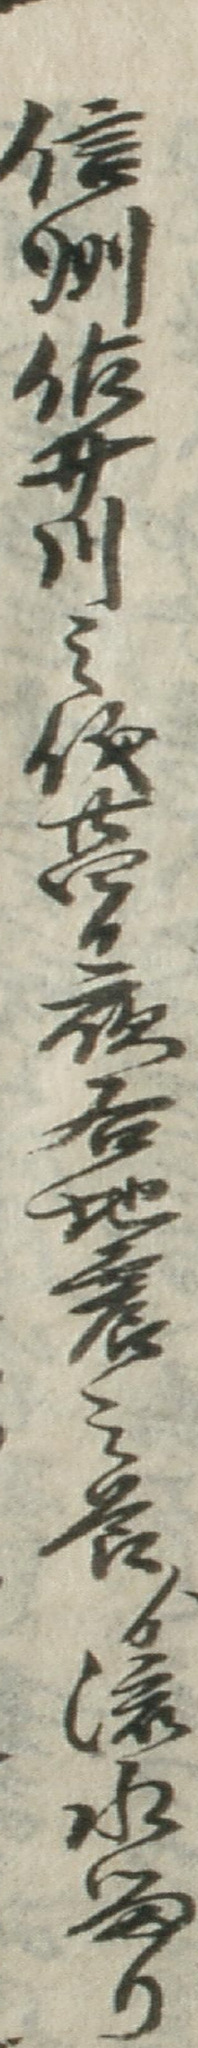一信州佐井川之儀廿四日夜右地震之節ゟ流水留り
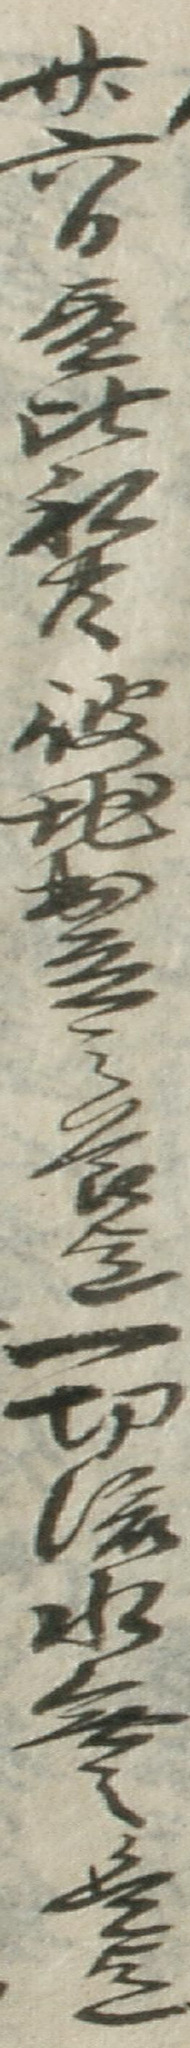廿六日昼比私共彼之地出立之節迄一切流水無之是迄
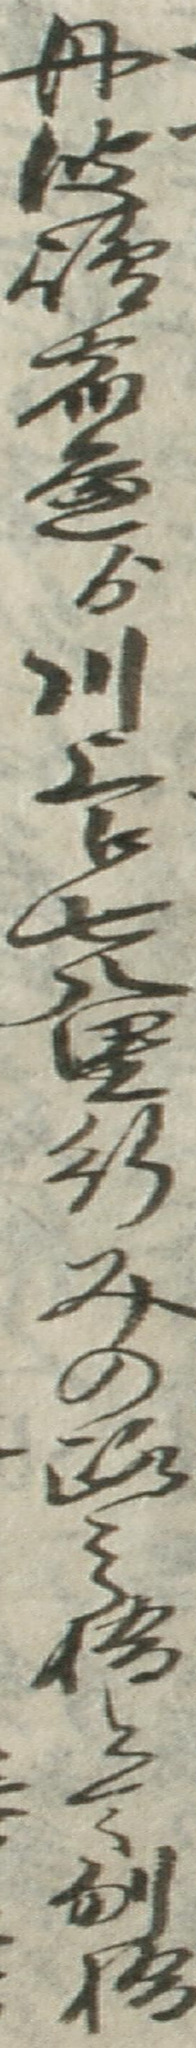丹波嶋宿辺ゟ川上江七八里行みの路之橋とて刎橋
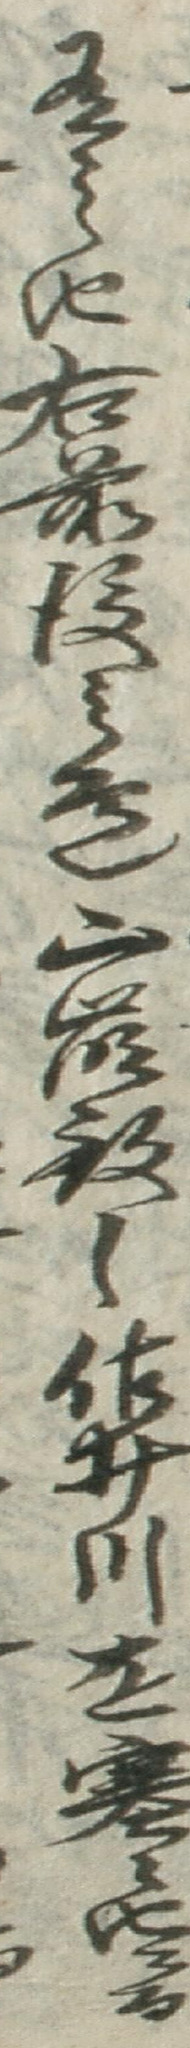有之候由右前後之辺山崩致し佐井川を塞候由二而
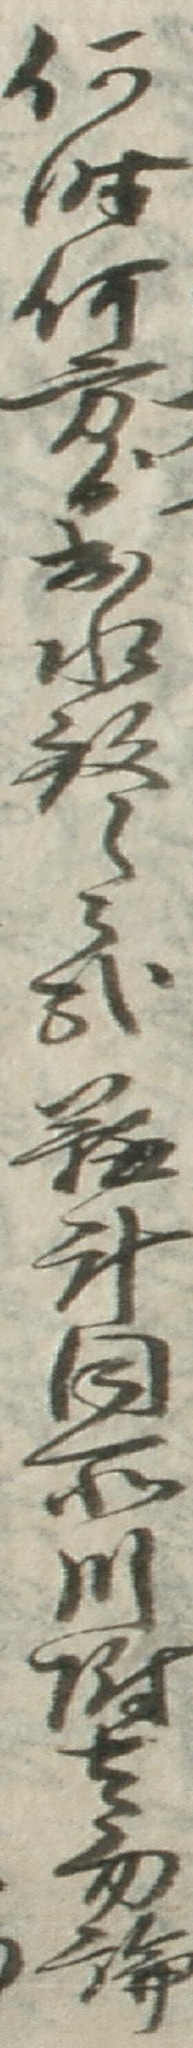何時何方ゟ出水致し候哉難計同所川附は勿論
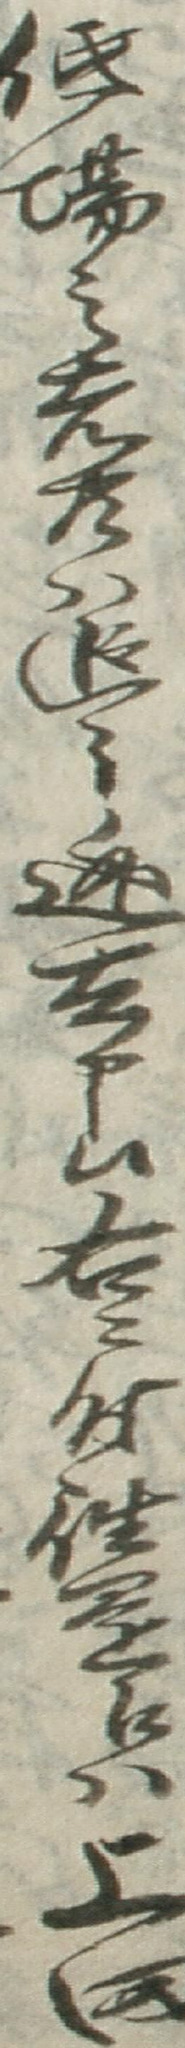低場之者共ハ追々逃去申候右二付往還江ハ上田
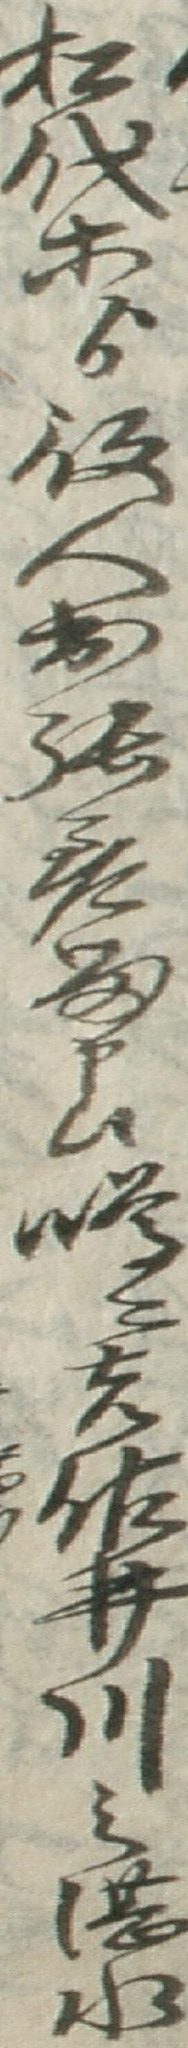松代等ゟ役人出張差留申候噂二は左井川之湛水
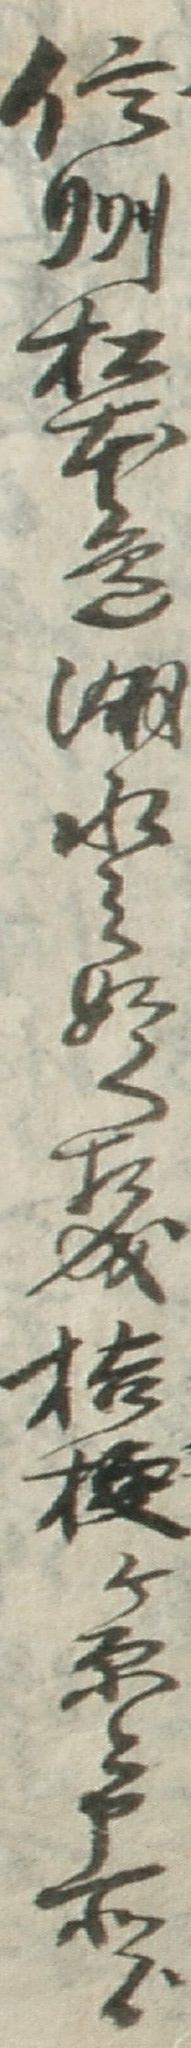信州松本辺湖水之如く相成桔梗ヶ原と申所ゟ

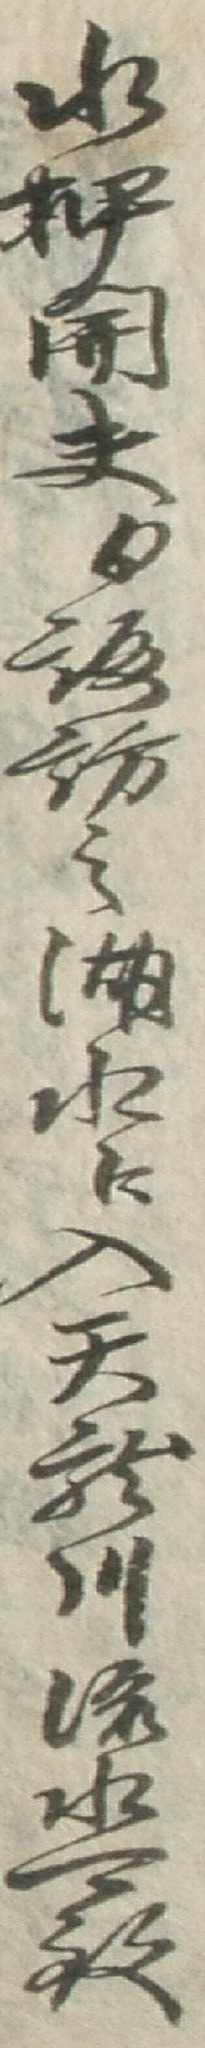水押開夫ゟ諏訪之湖水江入天龍川流水可致
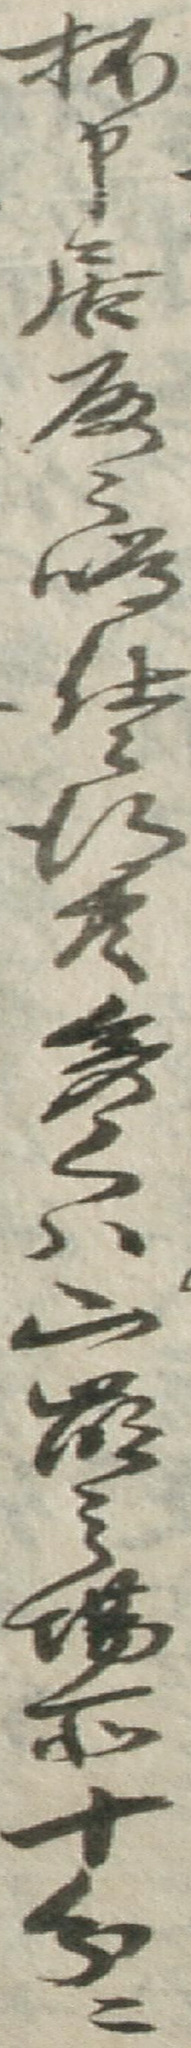抔申居度々噂仕候得共多くハ山崩之場所十分二
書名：信濃國地震實録記
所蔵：東京大学地震研究所図書室 Earthquake Research Institute Library, The University of Tokyo, JAPAN
